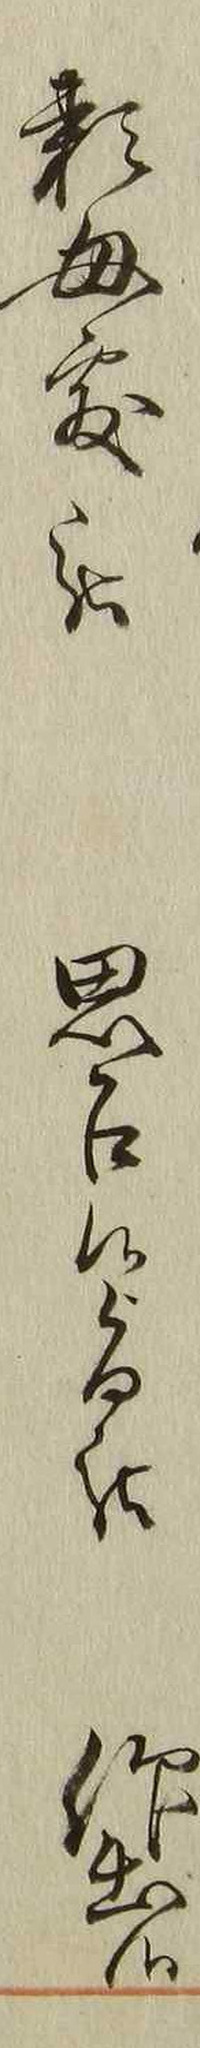頼母敷被思召候旨被仰出候
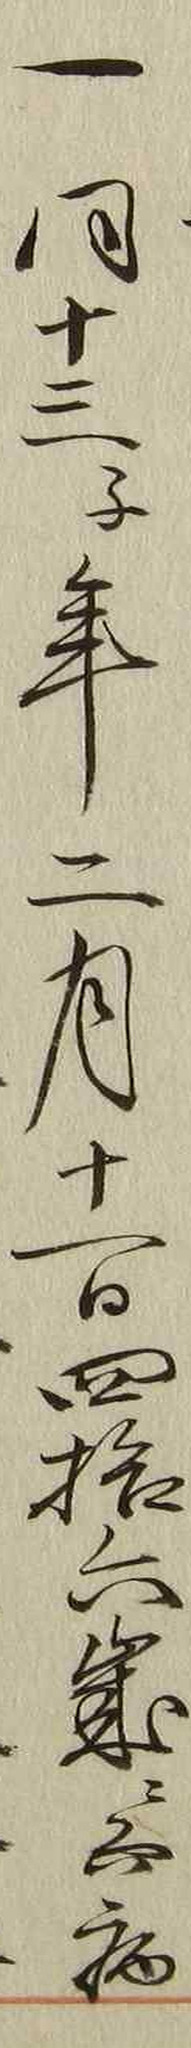一同十三子年二月十一日四拾六歳ニ而病
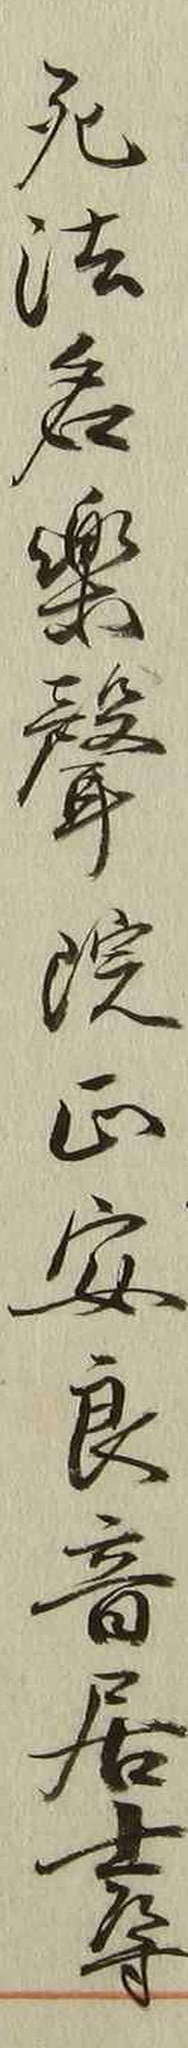死法名楽声院正安良音居士導
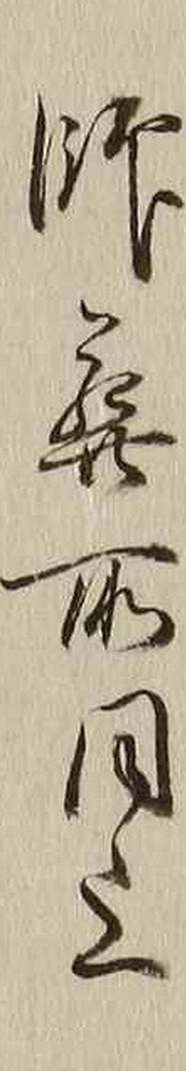師葬所同上
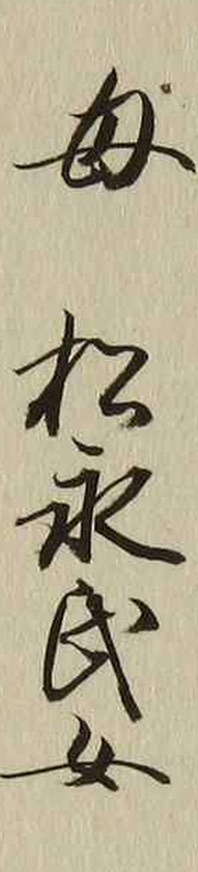母松永氏女
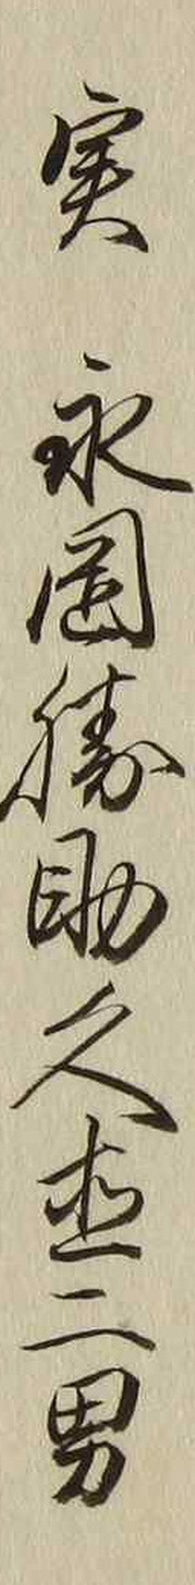実永岡勝助久直二男
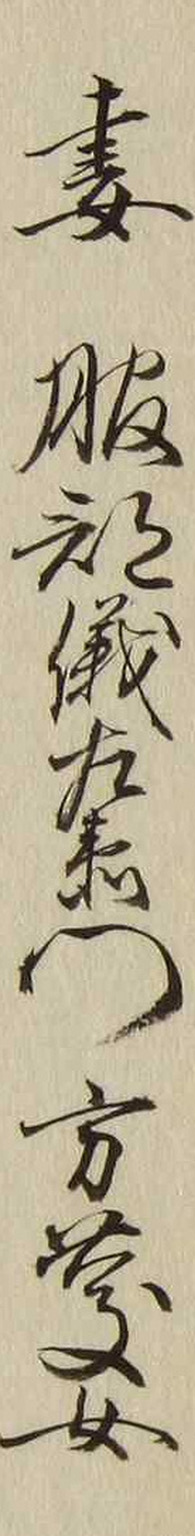妻服部儀左衛門方慶女

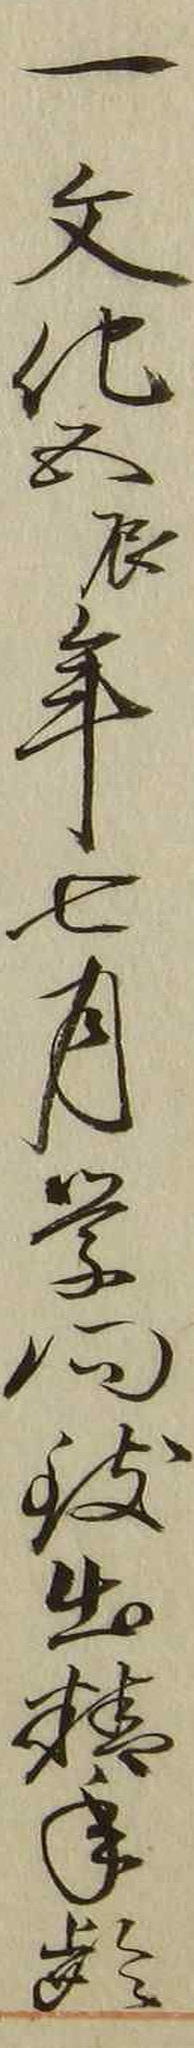文化五辰年七月学問致出精年齢
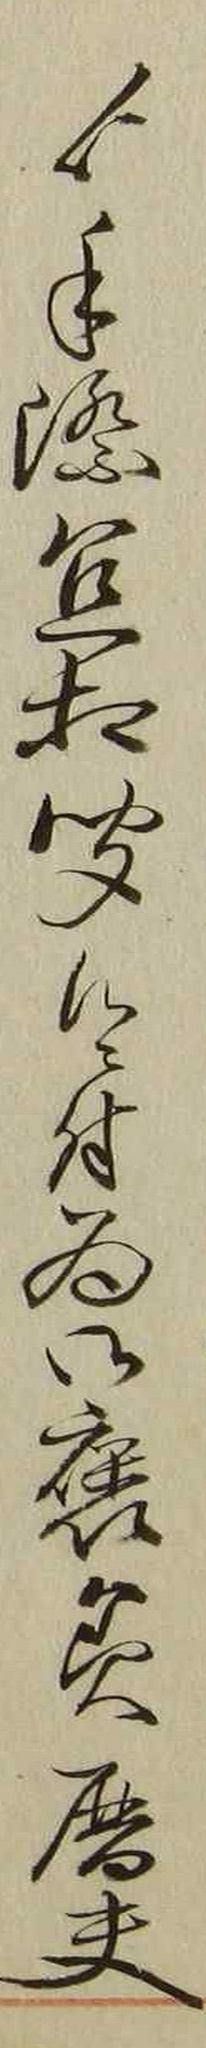ゟ手際宣相聞候ニ付為御褒美暦夫
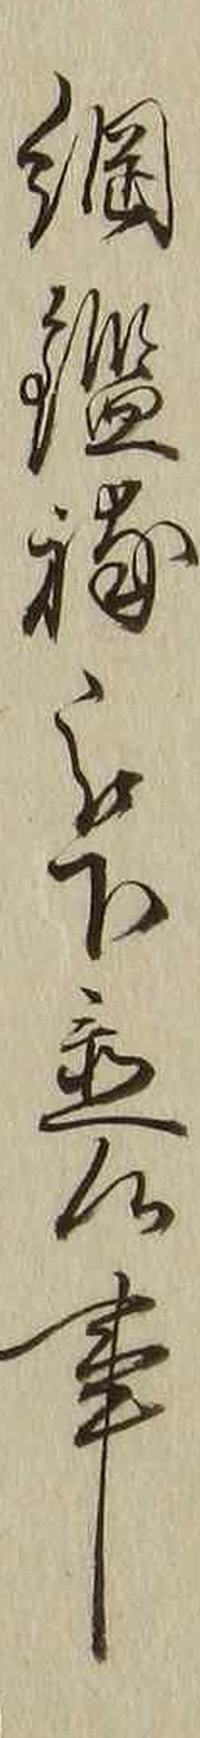綱鑑補被下置候事
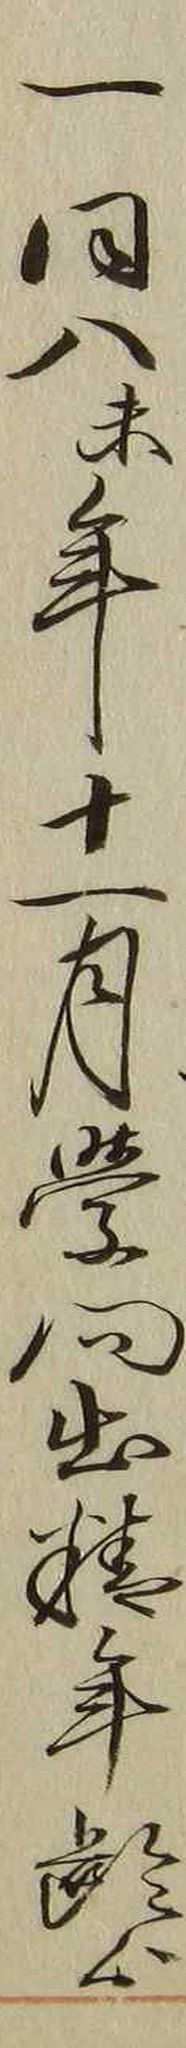一同八未年十一月学問出精年齢ゟ
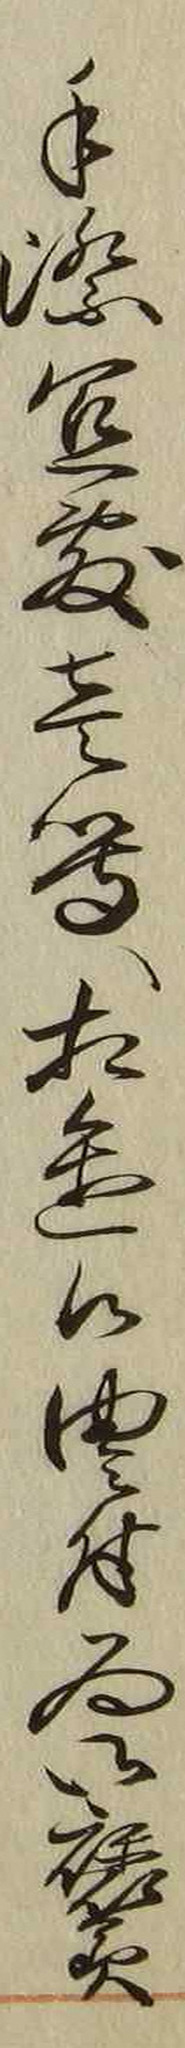手際宜敷壱等へ相進候由ニ付為御褒美
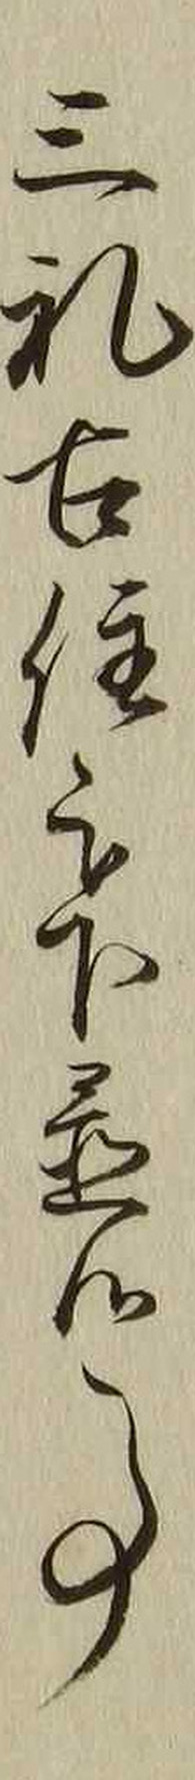三礼古住被下置候事
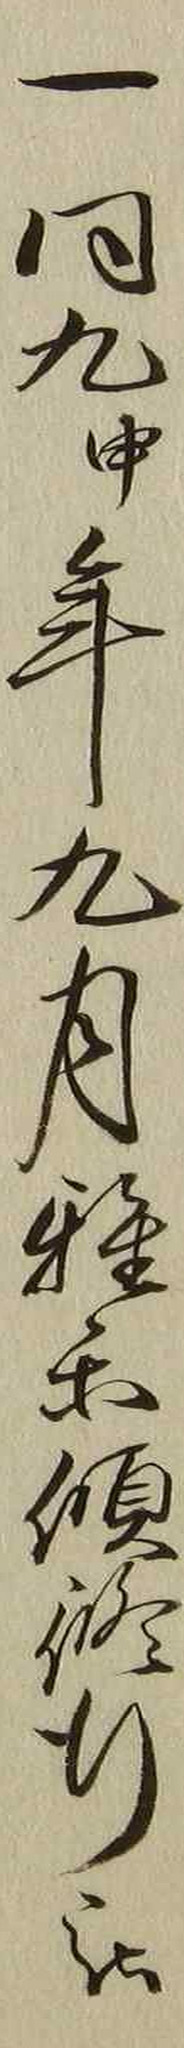一同九申年九月雅楽傾修行被
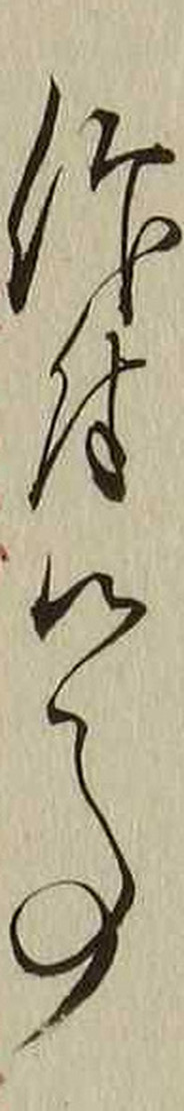仰付候事
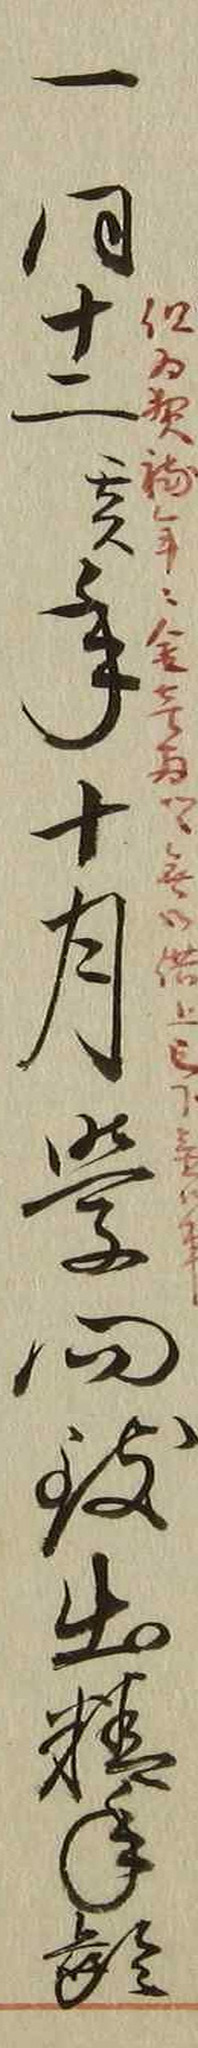一同十二亥年十月学問致出精年齢
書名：諸士系譜　巻之57　ほ之部4
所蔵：会津若松市立会津図書館
